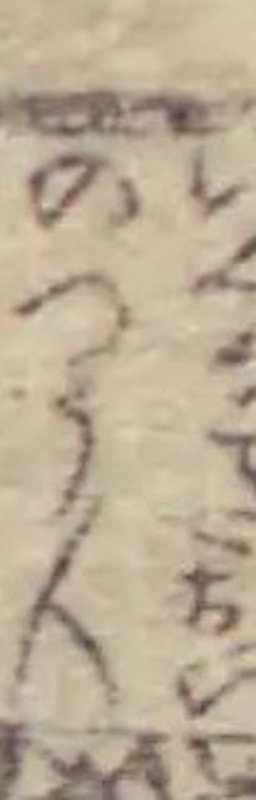のつう人
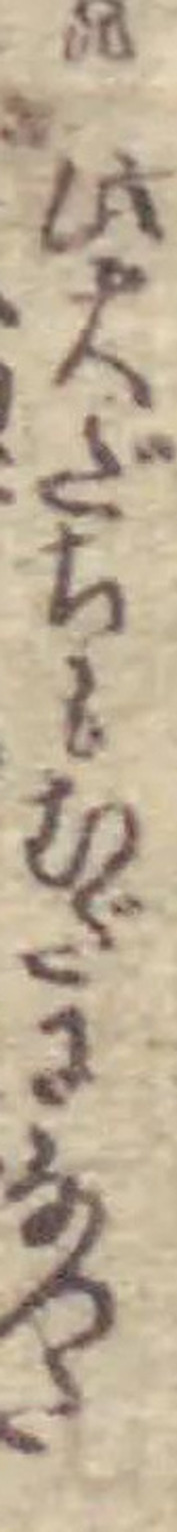此大だちもむだになつた
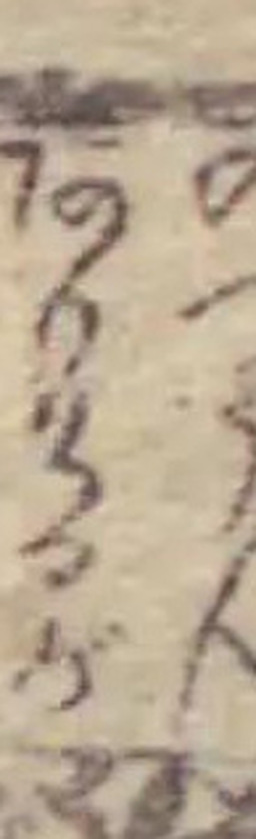ありけるが
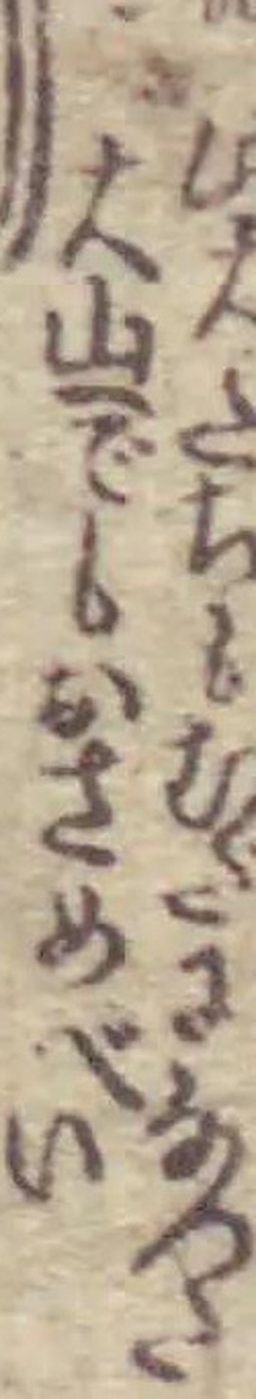大山へでもおさめべい
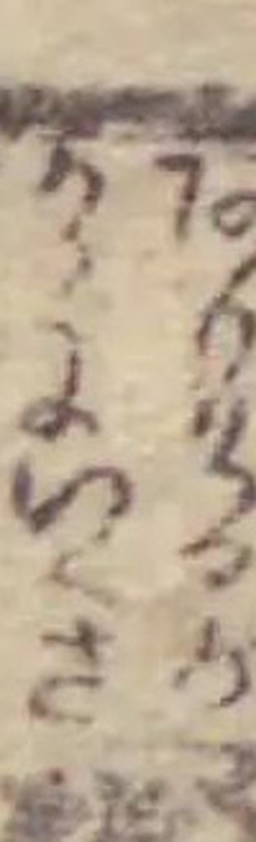からにいくさ
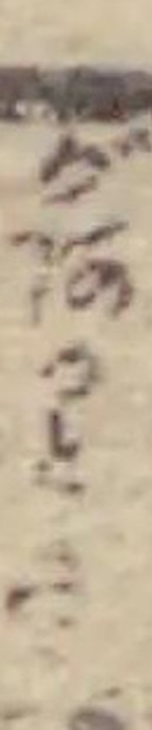があるときゝ
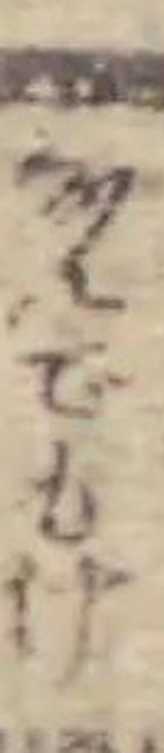なんでもけ
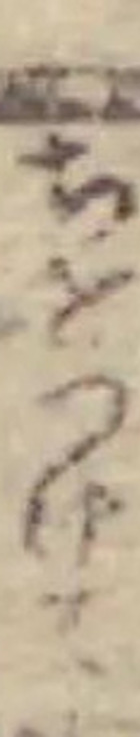ちをつけて
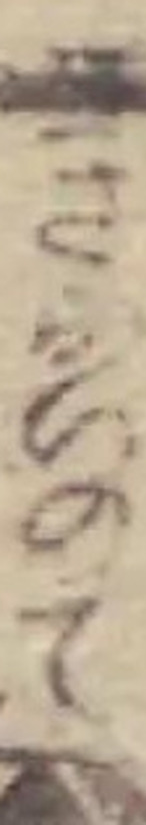きおいのて
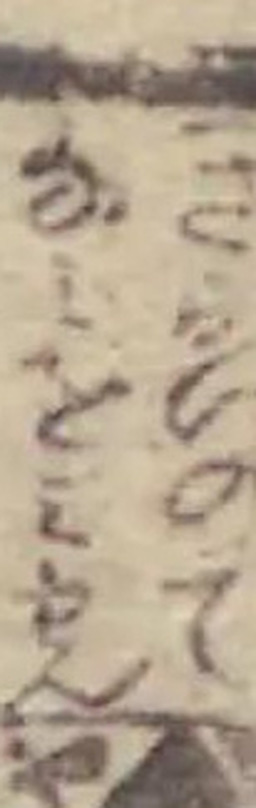なみをみせん
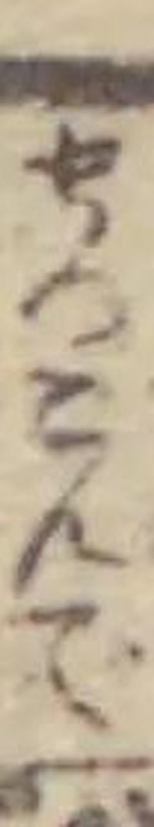せつこんで
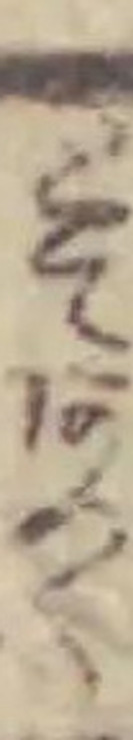とてあつく
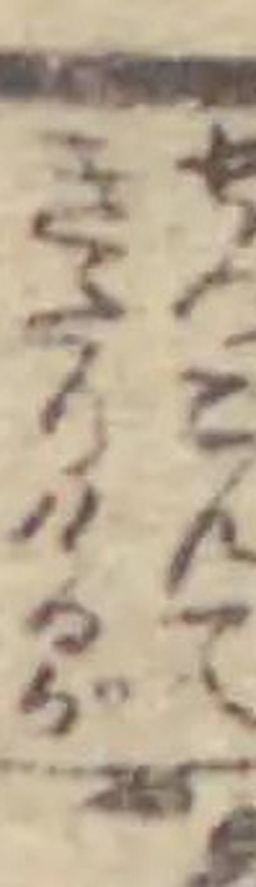きたりけるが
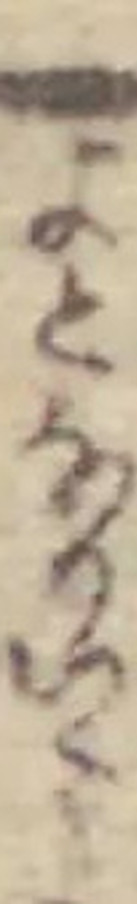よとなりいくさ
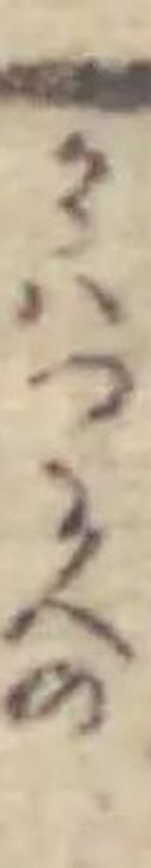からはつう人の
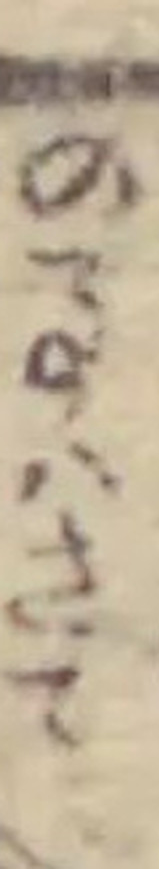の事はさて
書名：茶羅毛通人 3巻
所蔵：国立国会図書館 National Diet Library, JAPAN
